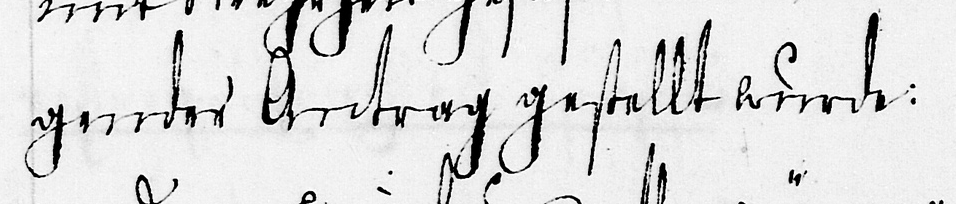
gender Antrag gestellt wurde:
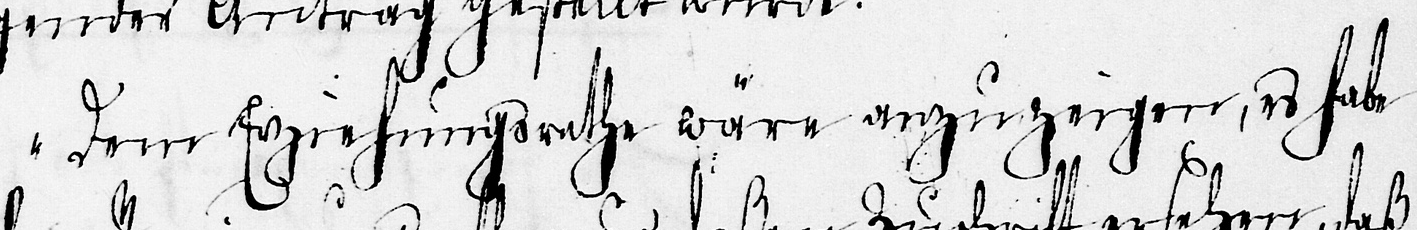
„Dem Erziehungsrathe wäre anzuzeigen, es habe
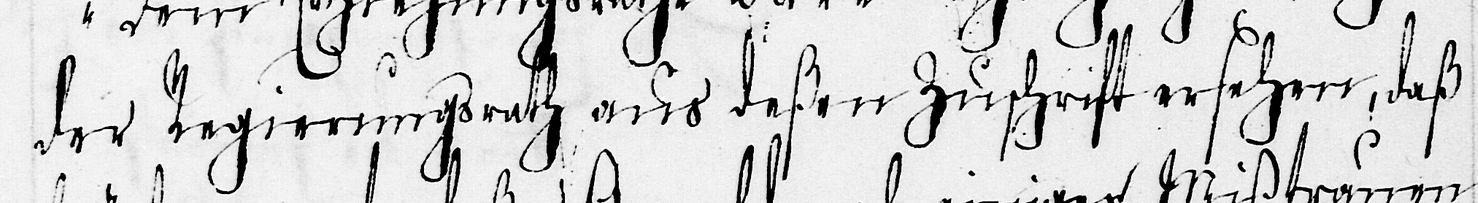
der Regierungsrath aus deßen Zuschrift ersehen, daß
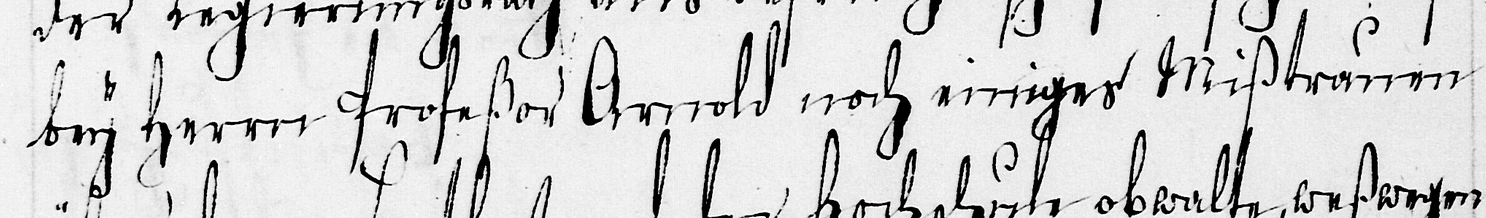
bey Herrn Profeßor Arnold noch einiges Mißtrauen
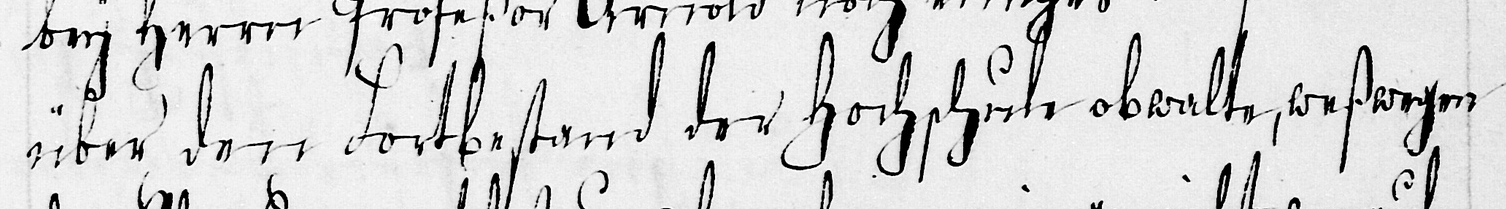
über den Fortbestand der Hochschule obwalte, weßwegen
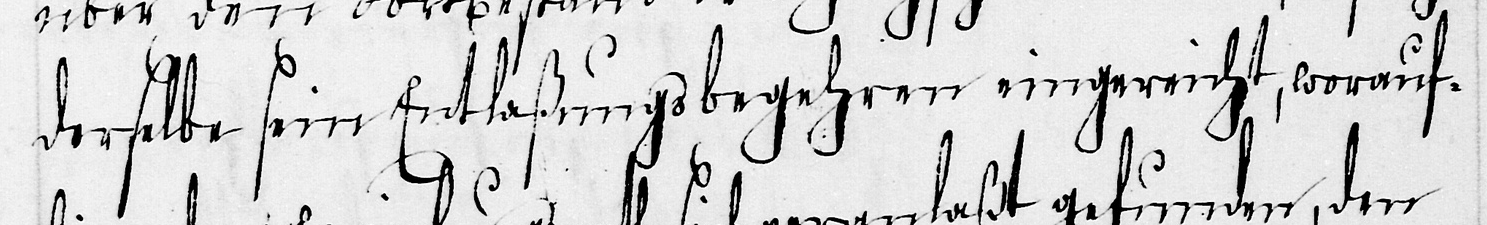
derselbe sein Entlaßungsbegehren eingereicht, worauf¬
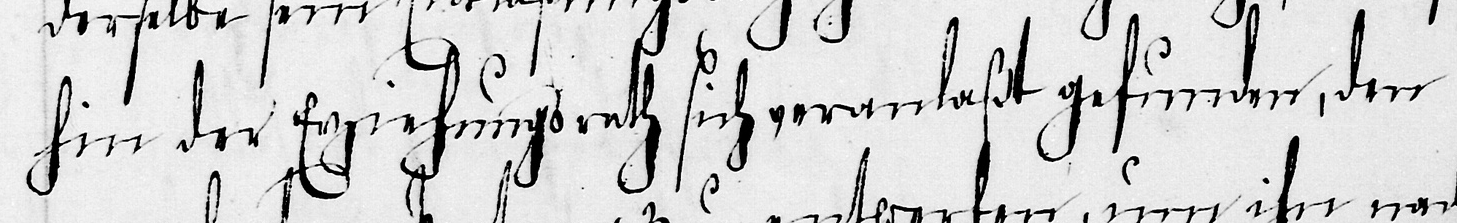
hin der Erziehungsrath sich veranlaßt gefunden, den
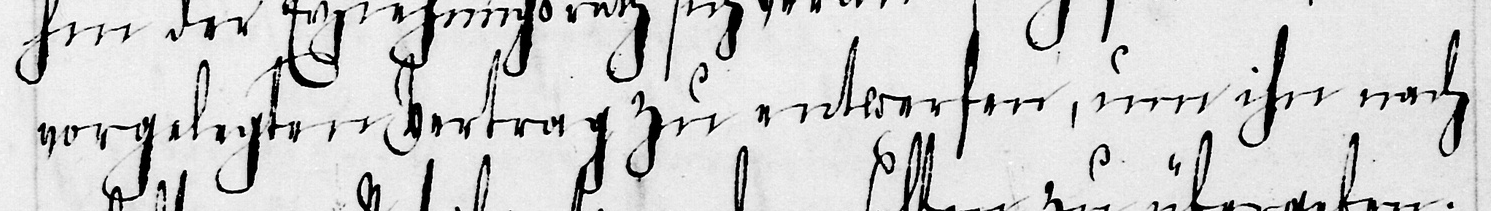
vorgelegten Vertrag zu entwerfen, um ihn nach
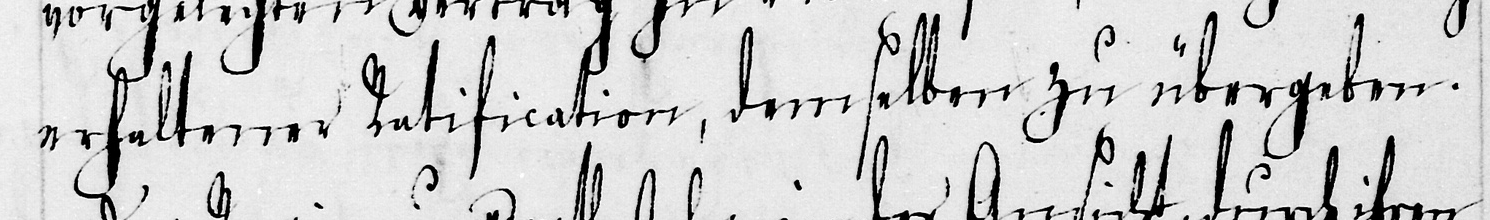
erhaltener Ratification, demselben zu übergeben.
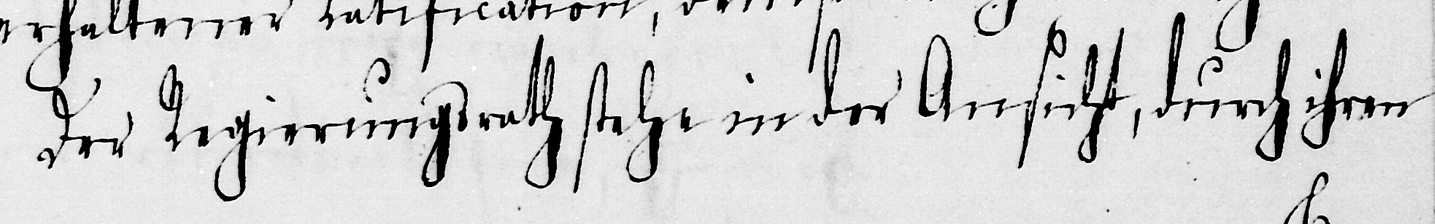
Der Regierungsrath stehe in der Ansicht, durch ihr¬
